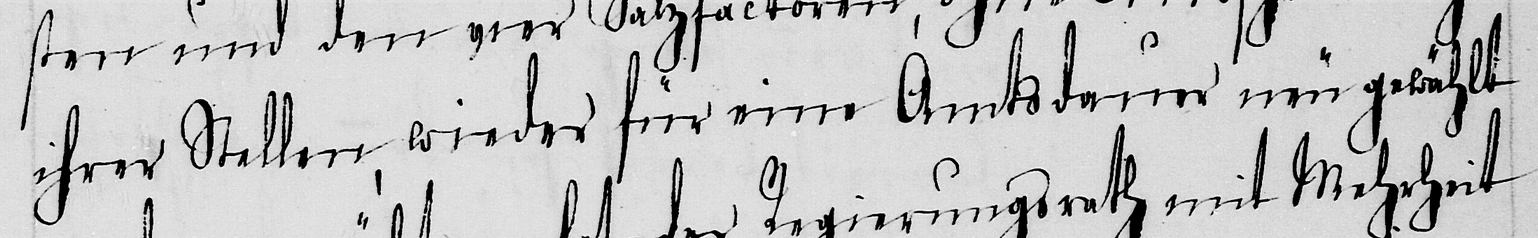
ihrer Stellen, wieder für eine Amtsdauer neu gewählt
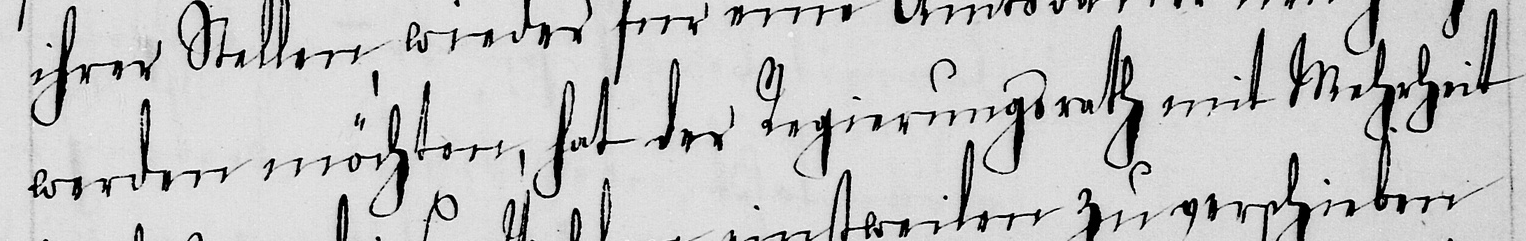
werden möchten, hat der Regierungsrath mit Mehrheit
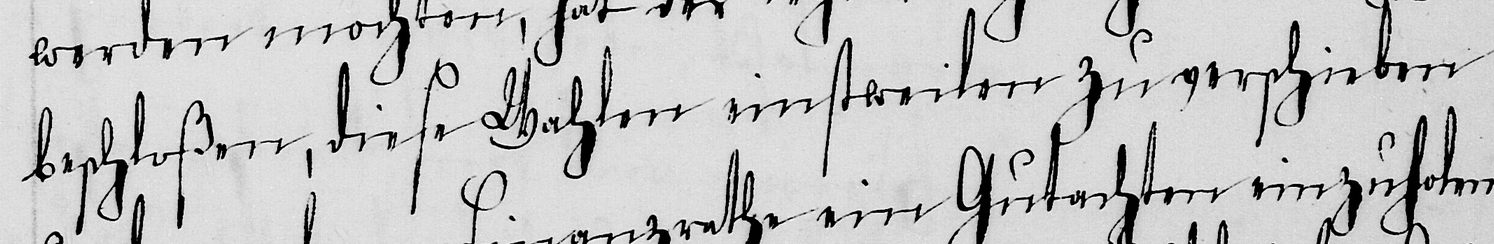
beschloßen, diese Wahlen einstweilen zu verschieben
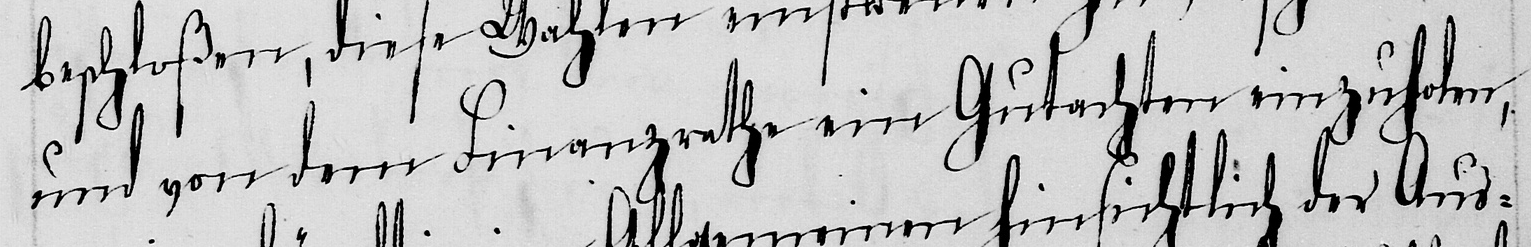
und von dem Finanzrathe ein Gutachten einzuholen,
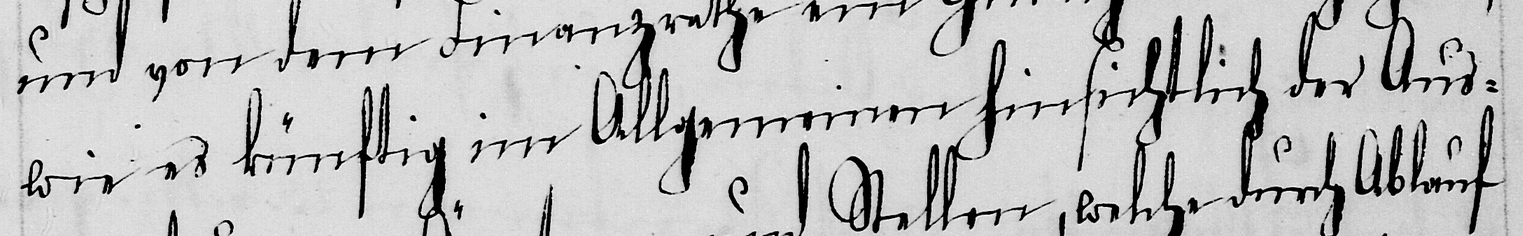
wie es künftig im Allgemeinen hinsichtlich der Aus¬
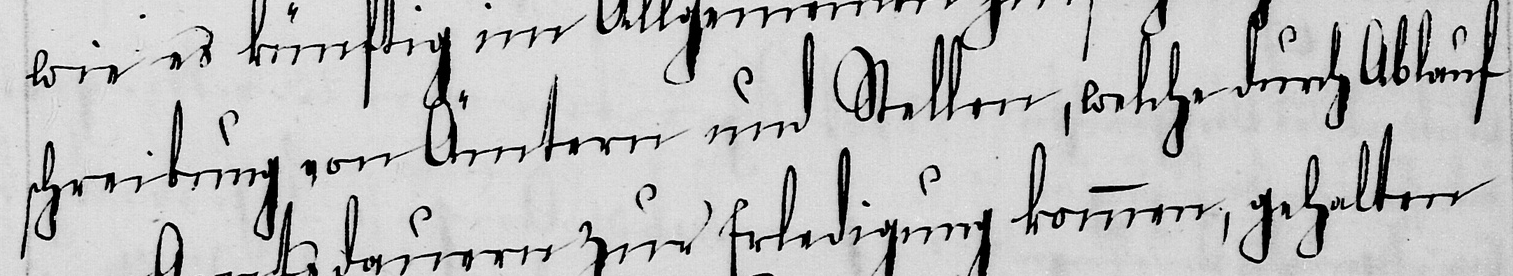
schreibung von Ämtern und Stellen, welche durch Abla¬
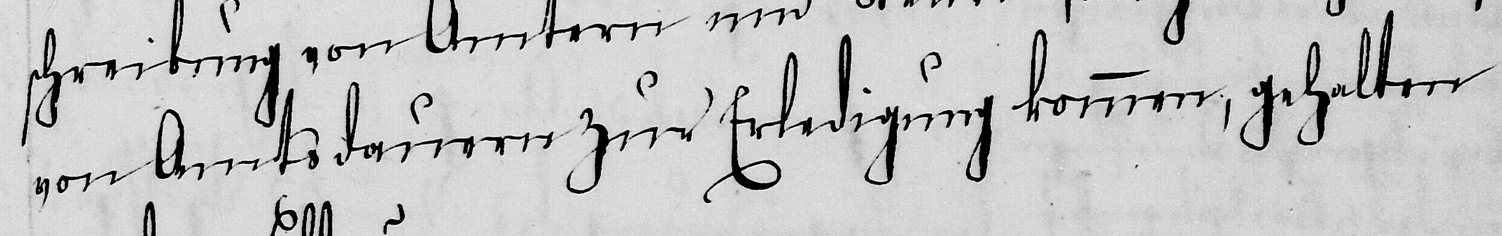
von Amtsdauern zur Erledigung kommen, gehalten
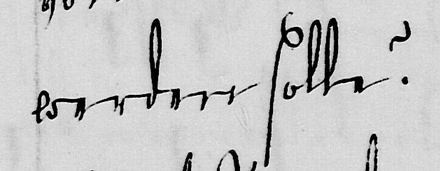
werden solle?
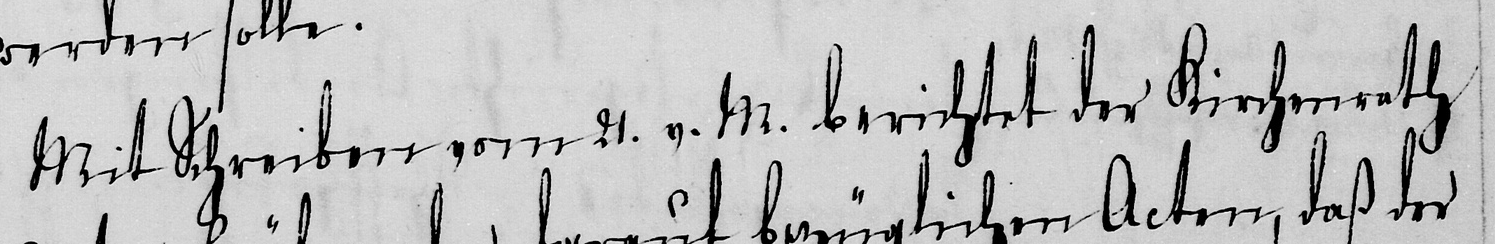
Mit Schreiben vom 21. v. M. berichtet der Kirchenrath
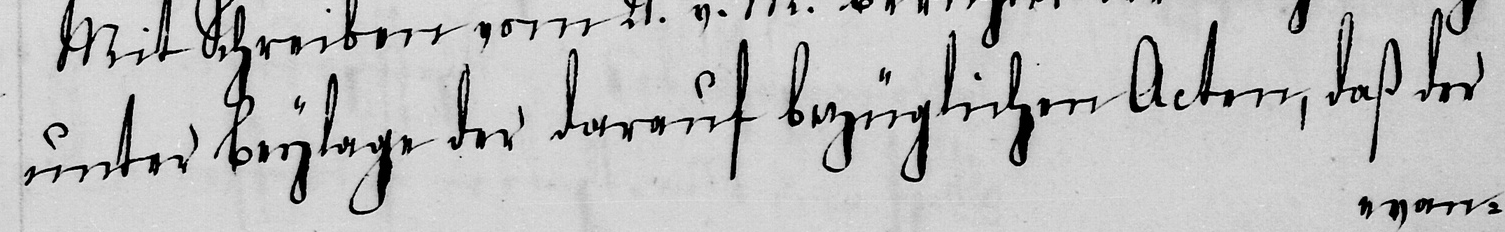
unter Beylage der darauf bezüglichen Acten, daß der
